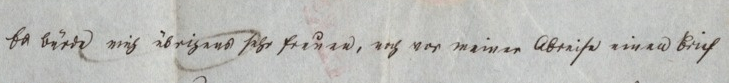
Es würde mich übrigens sehr freuen, noch vor meiner Abreise einen Brief
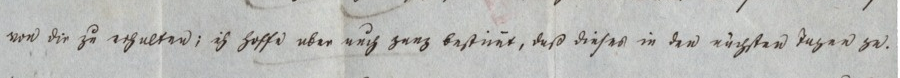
von dir zu erhalten; ich hoffe aber auch ganz bestimmt, daß dieses in den nächsten Tagen ge-
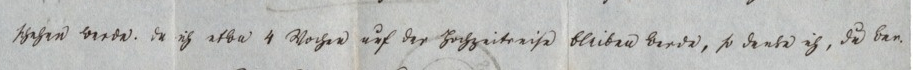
schehen werde. Da ich etwa 4 Wochen auf der Hochzeitreise bleiben werde, so denke ich, du wer-
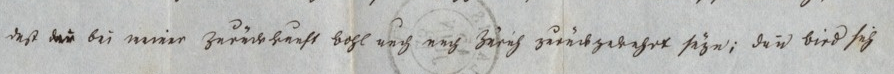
dest dann bei meiner Zurückkunft wohl auch nach Zürich zurückgekehrt seyn; dann wird sich
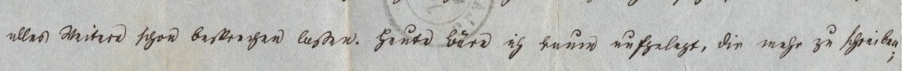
alles Weitere schon besprechen lassen. Heute wäre ich kaum aufgelegt, dir mehr zu schreiben;
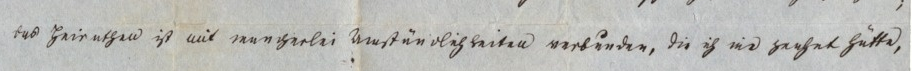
das Heirathen ist mit mancherlei Umständlichkeiten verbunden, die ich nie geahnt hätte,
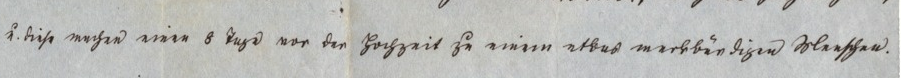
u. diese machen einen 8 Tage vor der Hochzeit zu einem etwas merkwürdigen Menschen.
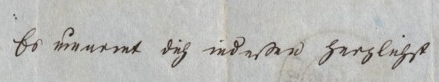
Es umarmt dich indessen herzlichst
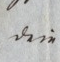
dein
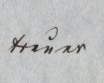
treuer
